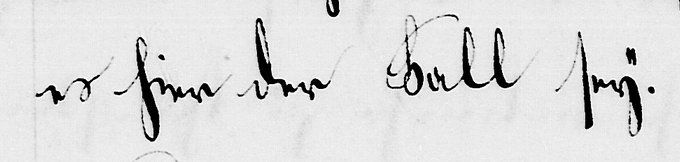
es hier der Fall sey.
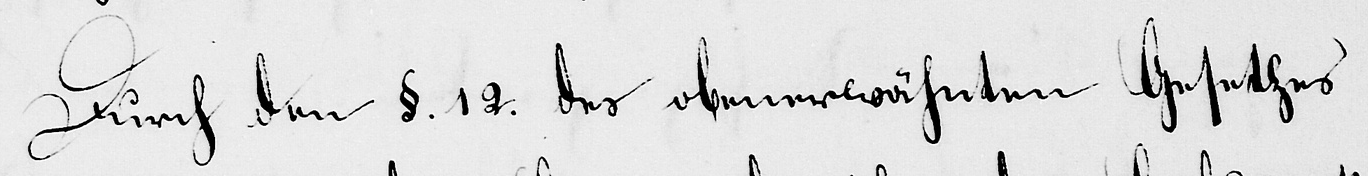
Durch den §. 12. des obenerwähnten Gesetzes
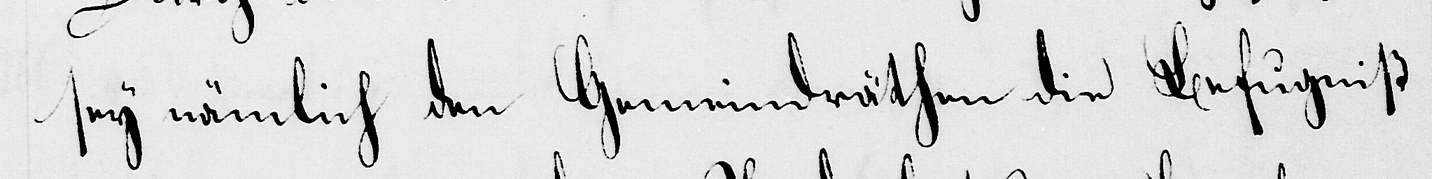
sey nämlich den Gemeindräthen die Befugniß
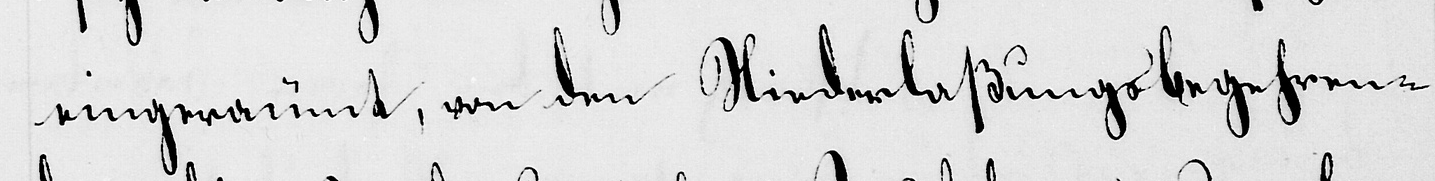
eingeräumt, von den Niederlaßungsbegehren¬
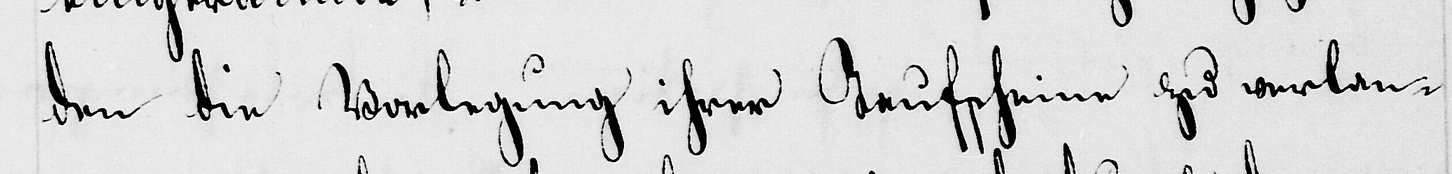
den die Vorlegung ihrer Taufscheine zu verlan¬
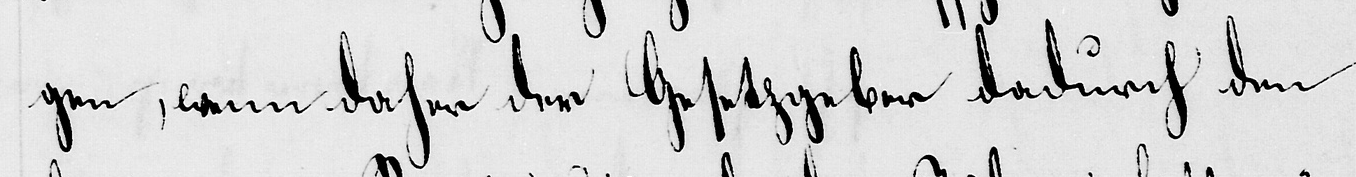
gen, wenn daher der Gesetzgeber dadurch den
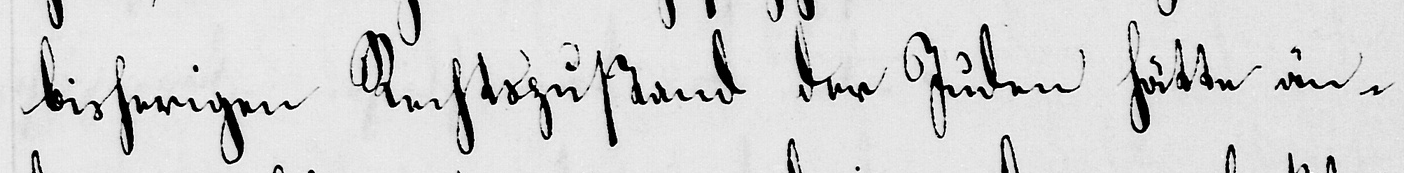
bisherigen Rechtszustand der Juden hätte än¬
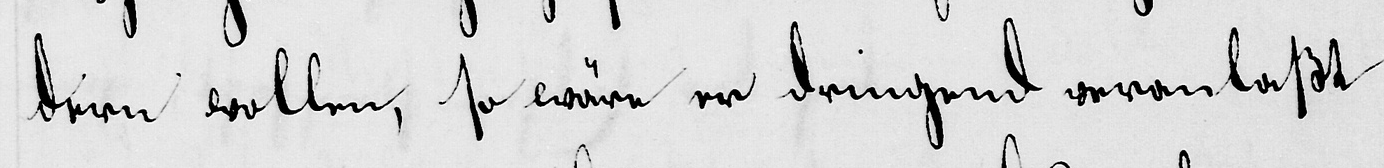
dern wollen, so wäre er dringend veranlaßt
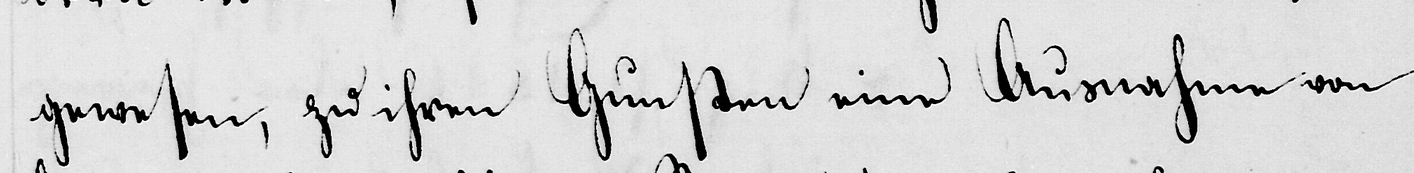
gewesen, zu ihren Gunsten eine Ausnahme von
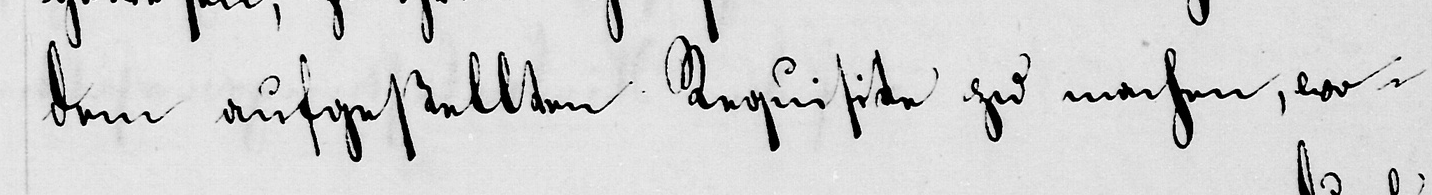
dem aufgestellten Requisite zu machen, wo-
